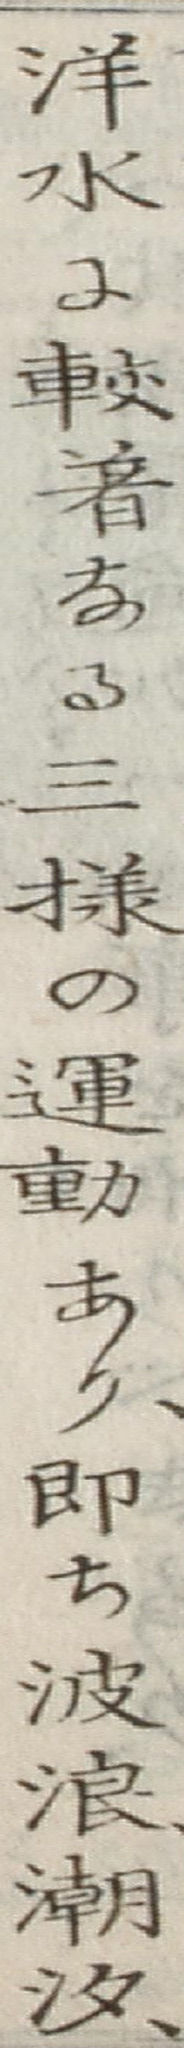洋水に較著なる三様の運動あり、即ち波浪、潮汐、
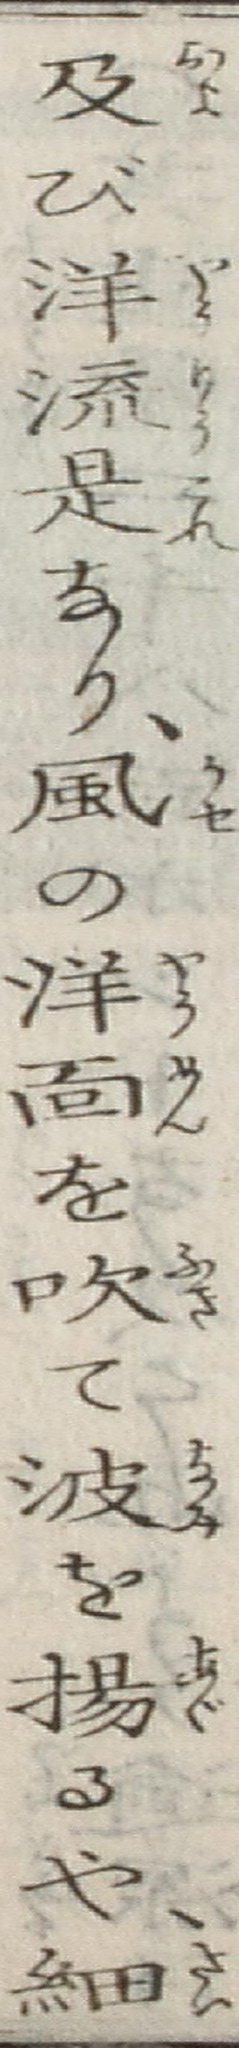及び洋流是なり、風の洋面を吹て波を揚るや、細
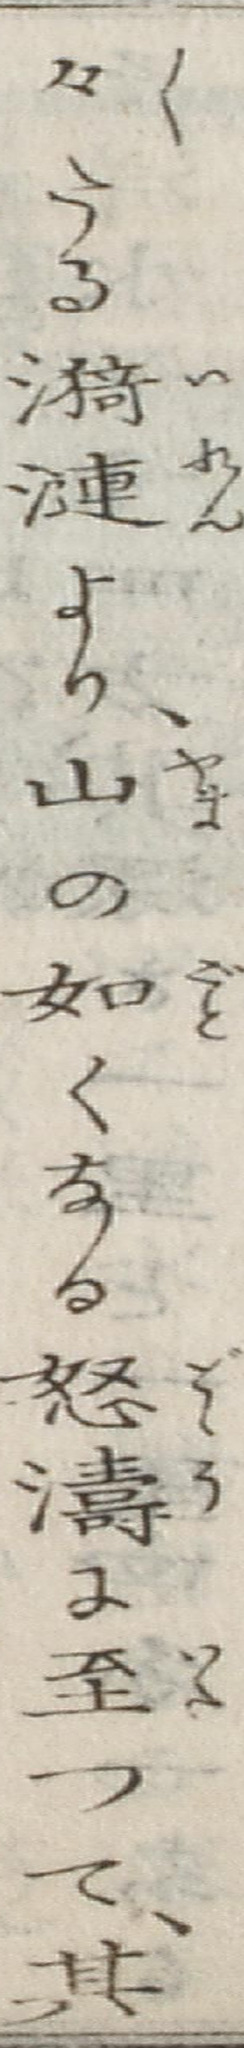々たる漪漣より、山の如くなる怒涛に至つて、其
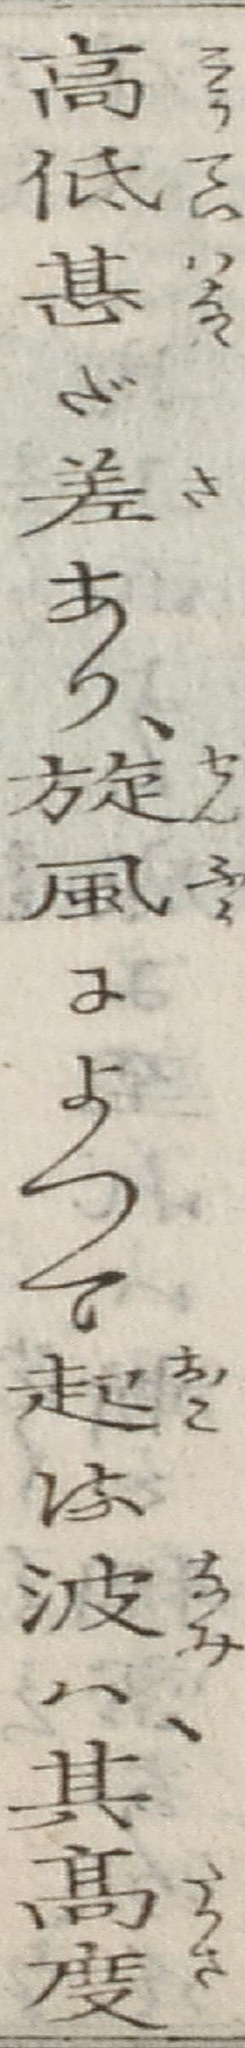高低甚だ差あり、旋風によつて起る波は、其高度
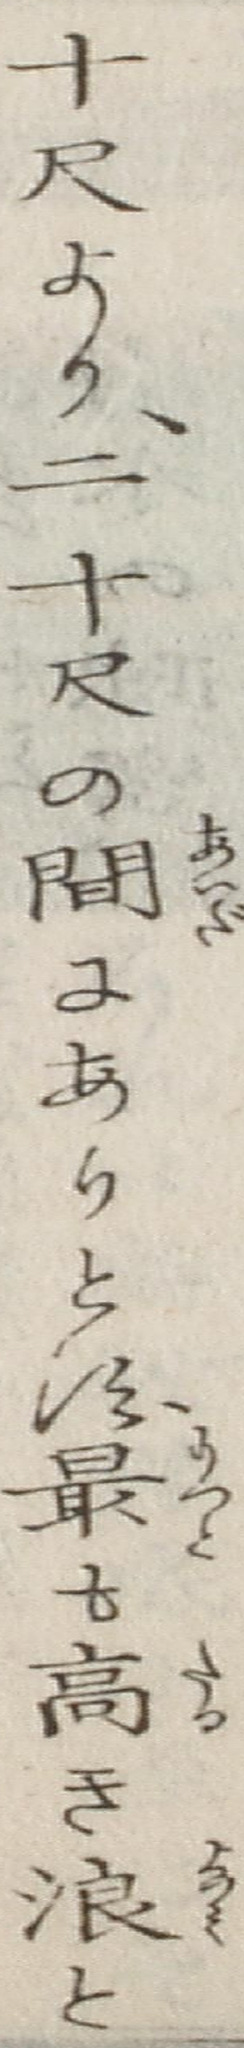十尺より、二十尺の間にありとす、最も高き浪と
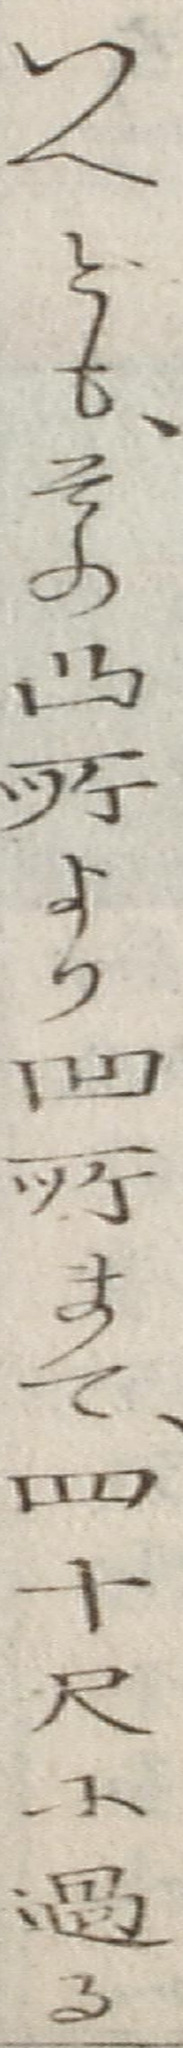いへとも、その凸所より凹所まて、四十尺に過る
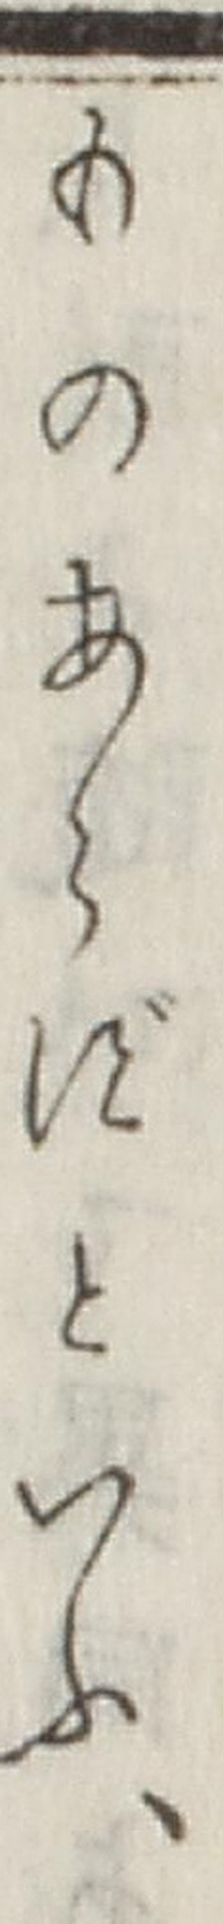ものあらずといふ、
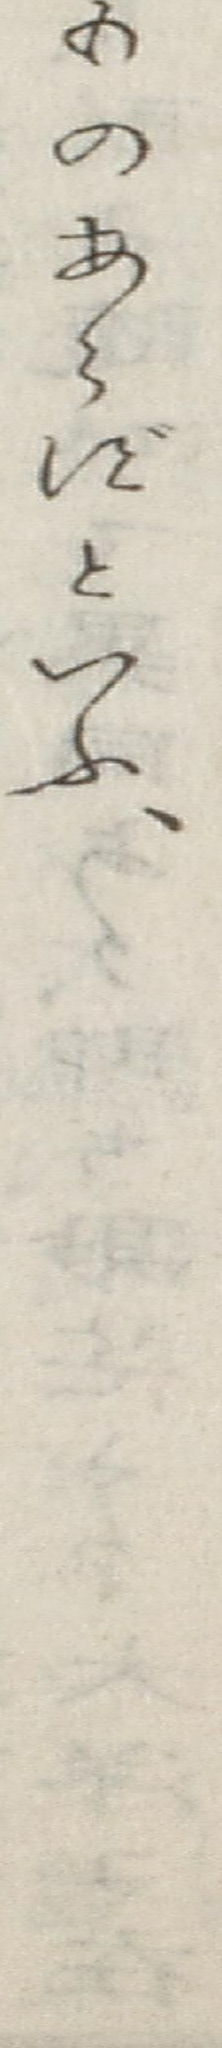ものあらずといふ、
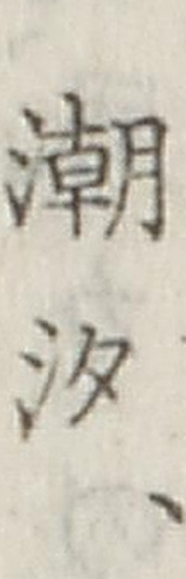潮汐、
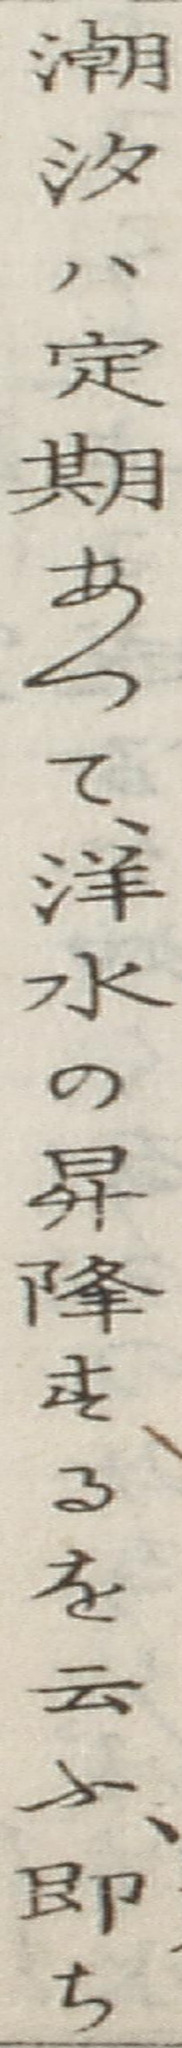潮汐は定期あつて、洋水の昇降するを云ふ、即ち
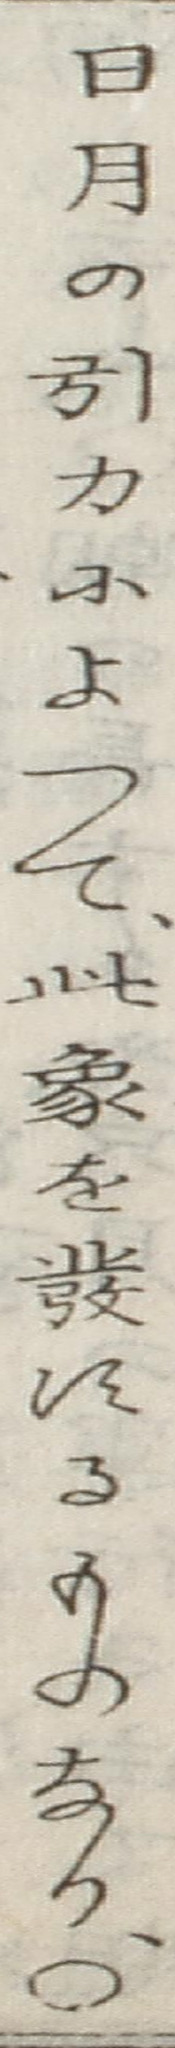日月の引力によつて、此象を発するものなり、○
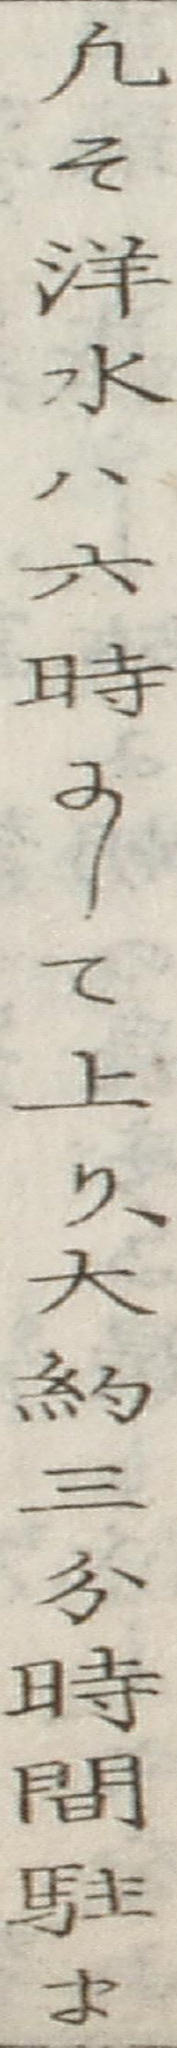凡そ洋水は六時にして上り、大約三分時間駐ま
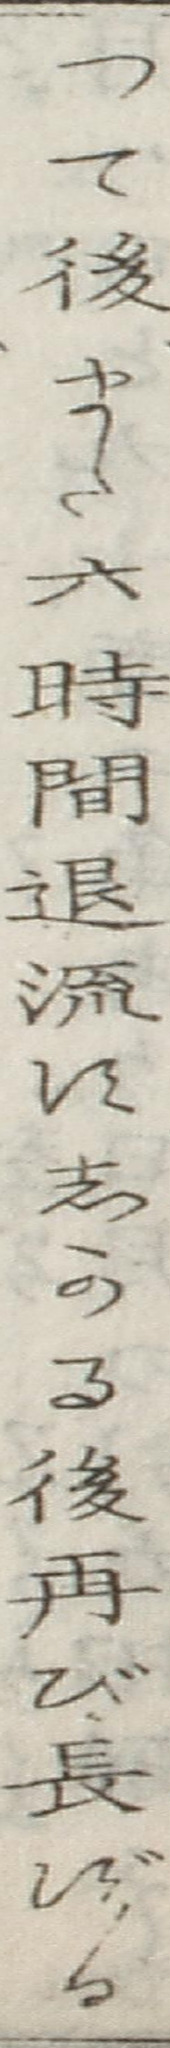つて後、また六時間退流す、しかる後再び長ずる
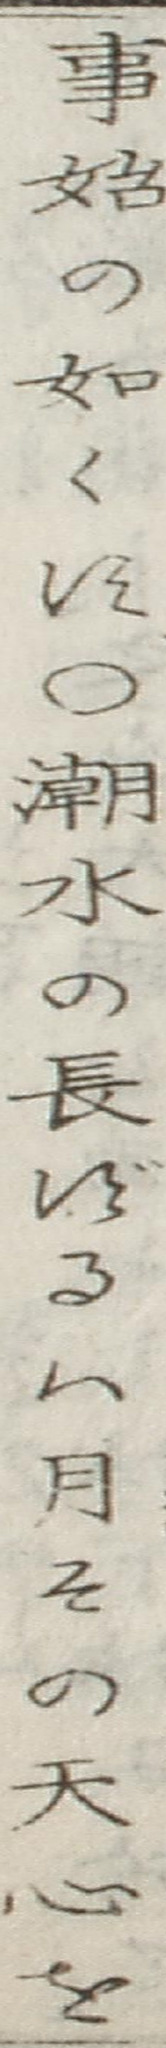事始の如くす、○潮水の長ずるは月その天心を
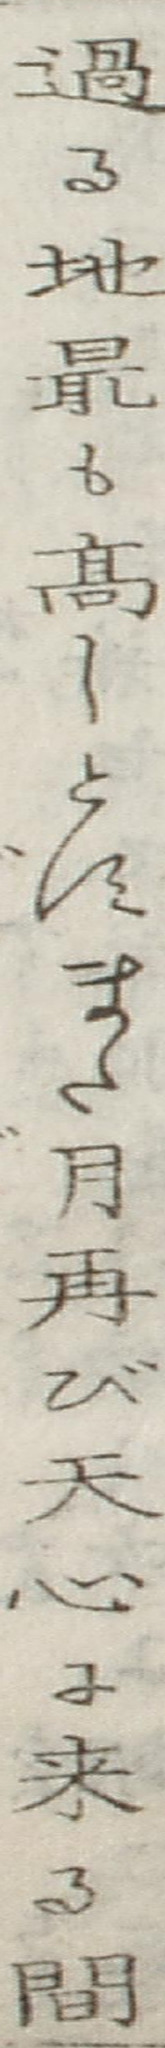過る地最も高しとす、また月再び天心に来る間
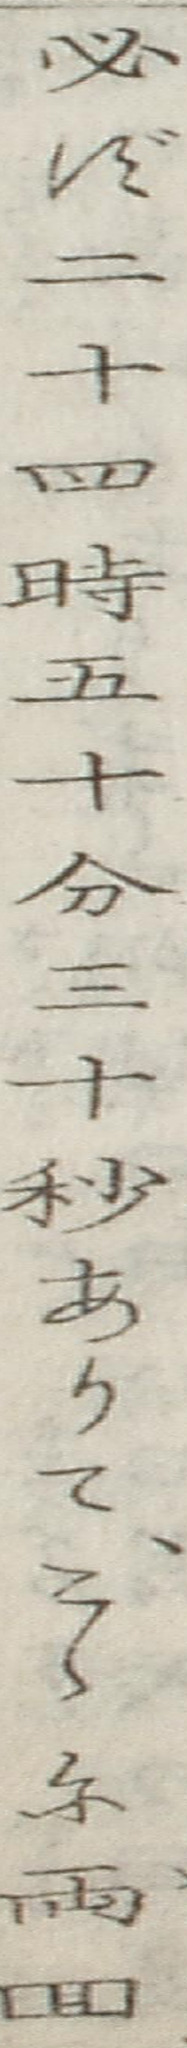必ず二十四時五十分三十秒ありて、こゝに両面
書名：訓蒙　天然地理學　中
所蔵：東京大学地震研究所図書室 Earthquake Research Institute Library, The University of Tokyo, JAPAN
